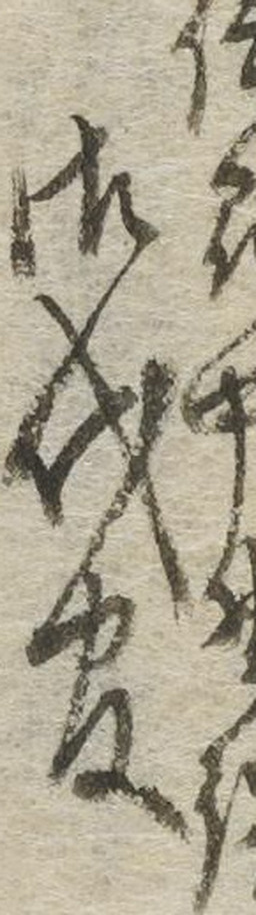御代官
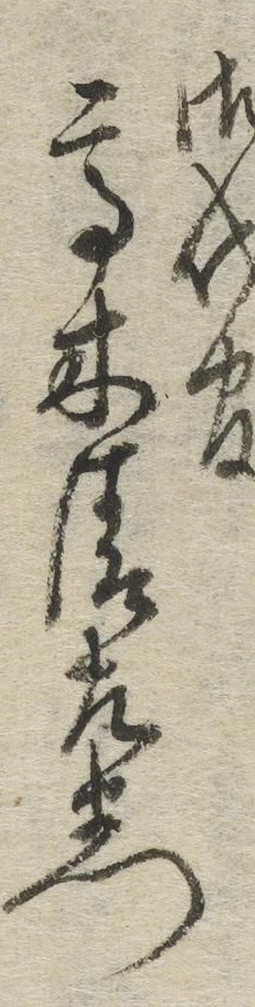高木清左衛門
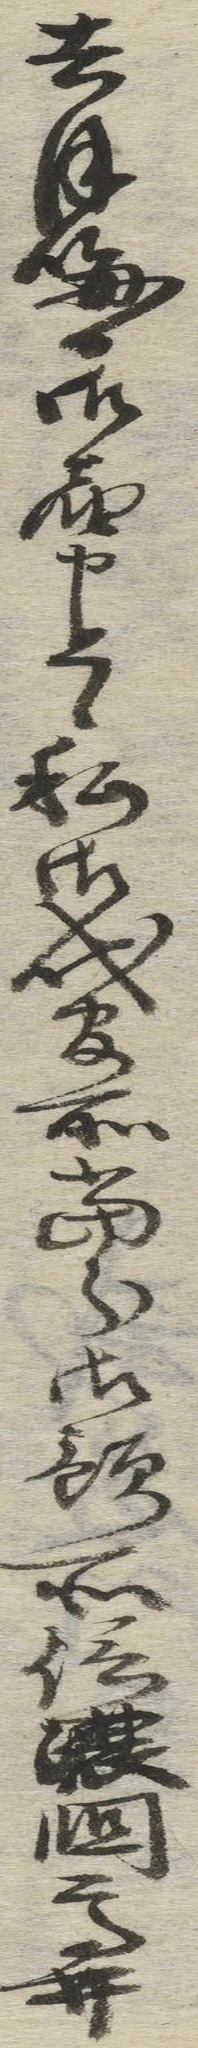去月晦日御届申上候私御代官所当分御預所信濃国高井
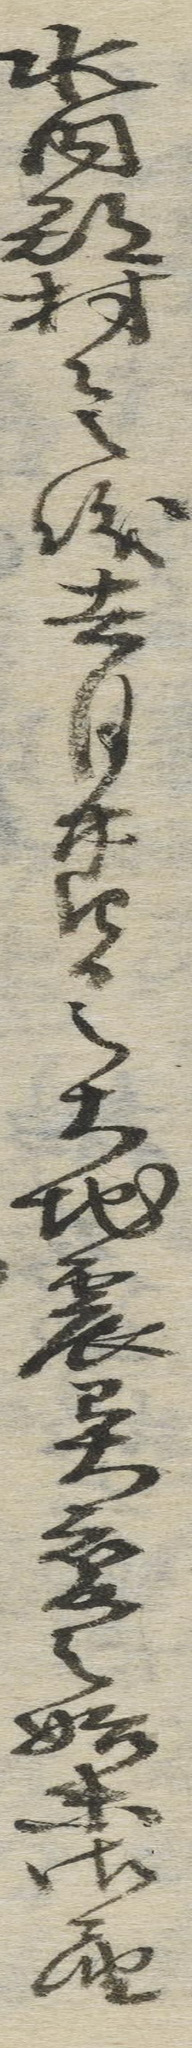水内郡村々之儀去月廿四日之大地震異変之始末御届
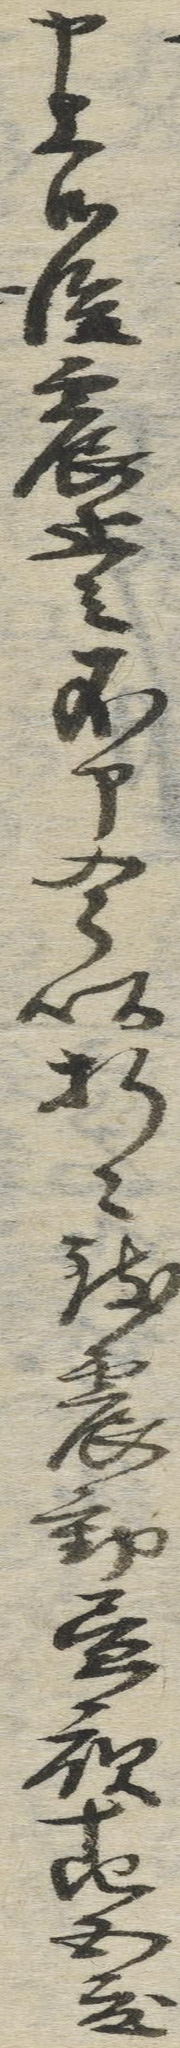申上候後震止ミ不申今以折々致震動昼夜十四五度
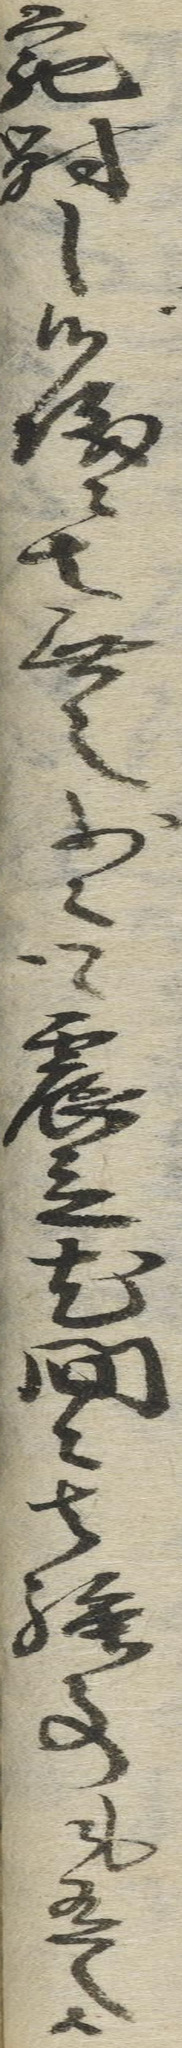宛致し候儀二は無之少々ツヽ震立尤間々は強事も有之候
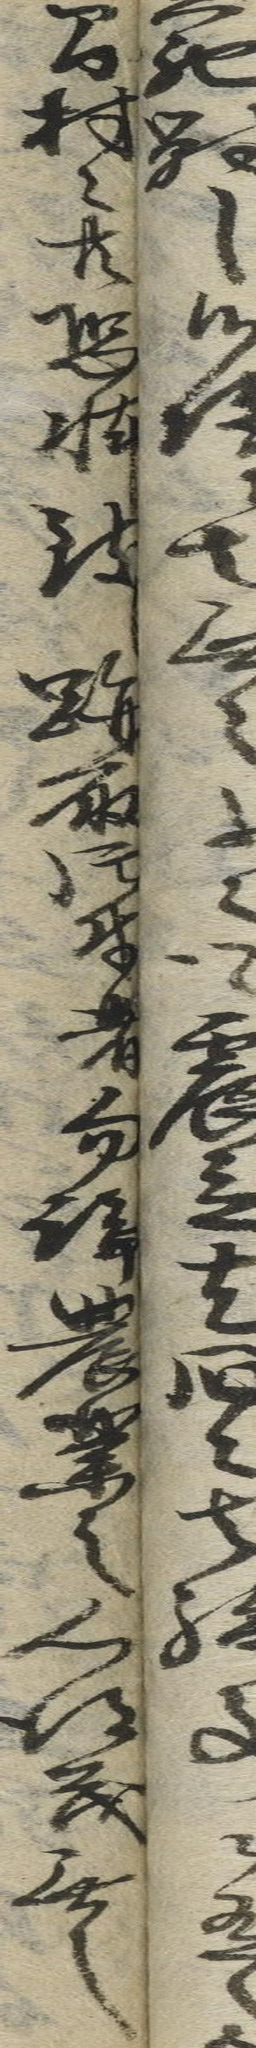間村々共恐怖致跡取片付は勿論農業之心得も無之
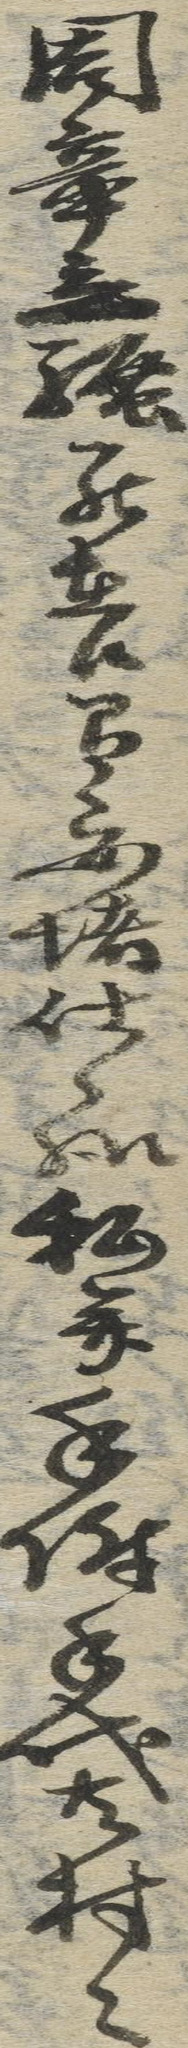周章立騒罷在候間々安堵仕候様私并手附手代共村々
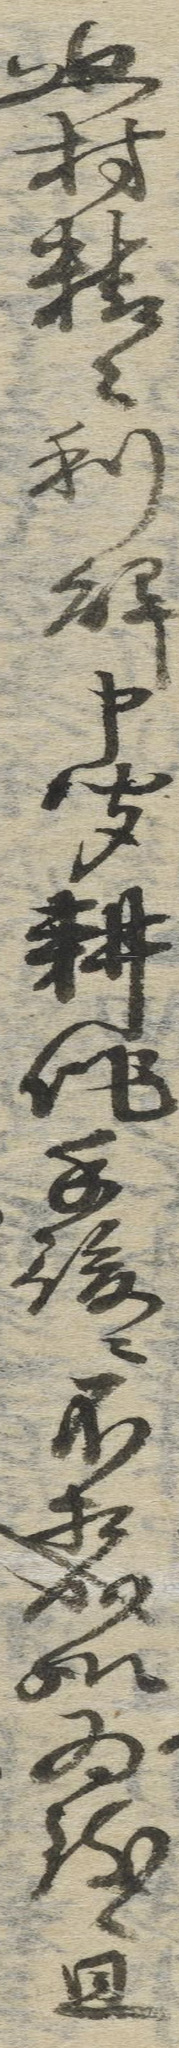廻村精々利解申聞耕作手後二不相成様為致候且
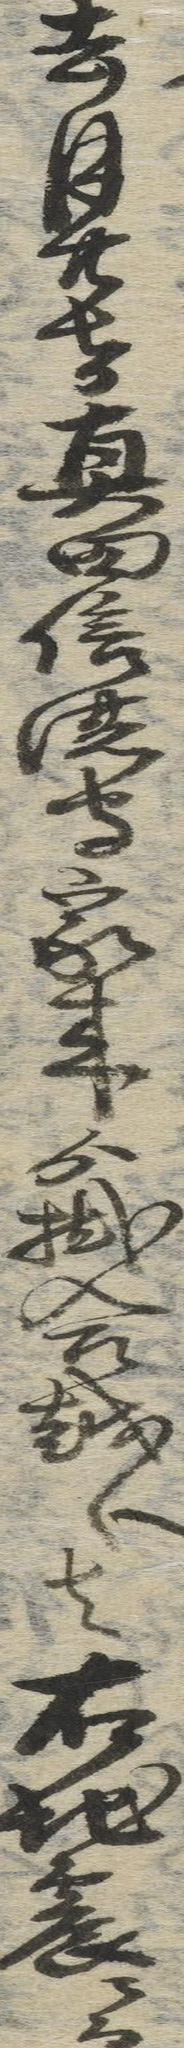去月廿七日真田信濃守家来ゟ掛合越候は右地震二而
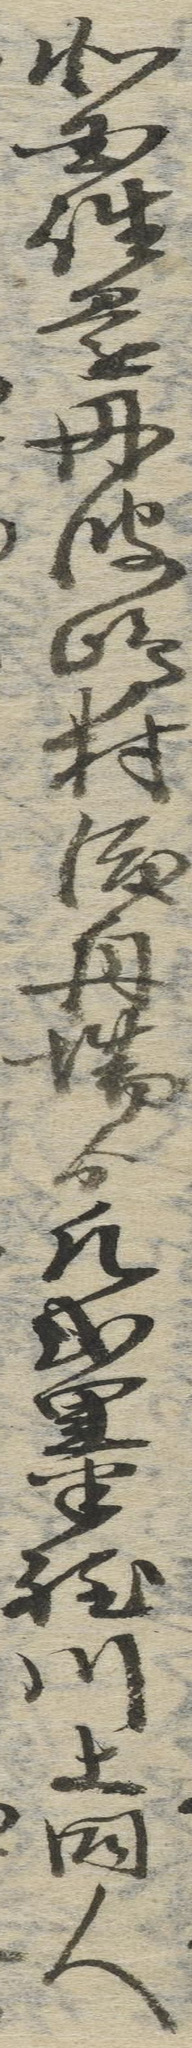北国往還丹波嶋村渡舟場ゟ凡弐里半程川上同人
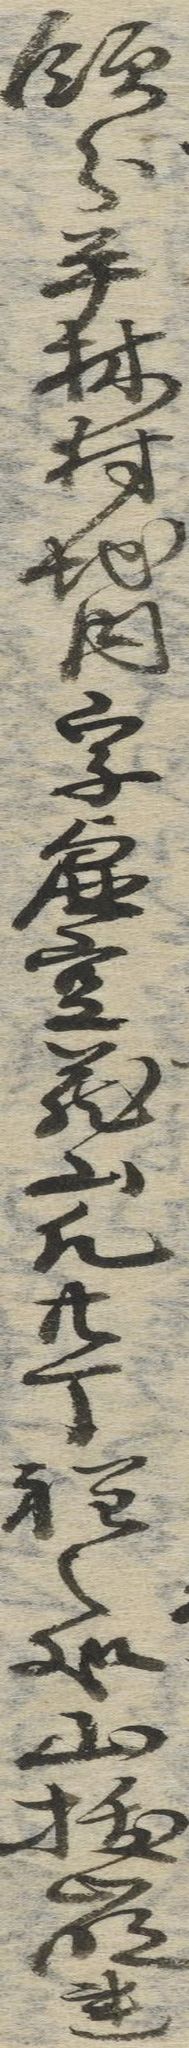領分平林村地内字虚空蔵山凡廿丁程之処山抜崩れ
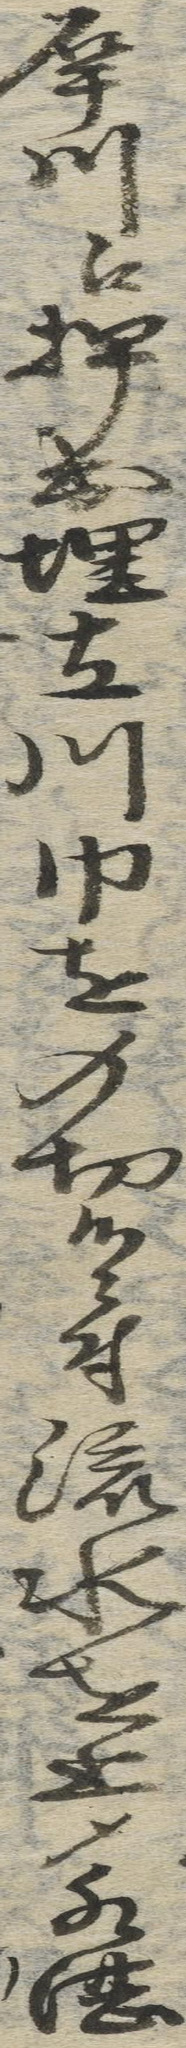犀川江押出埋立川幅を〆切候二付流水を止メ水湛
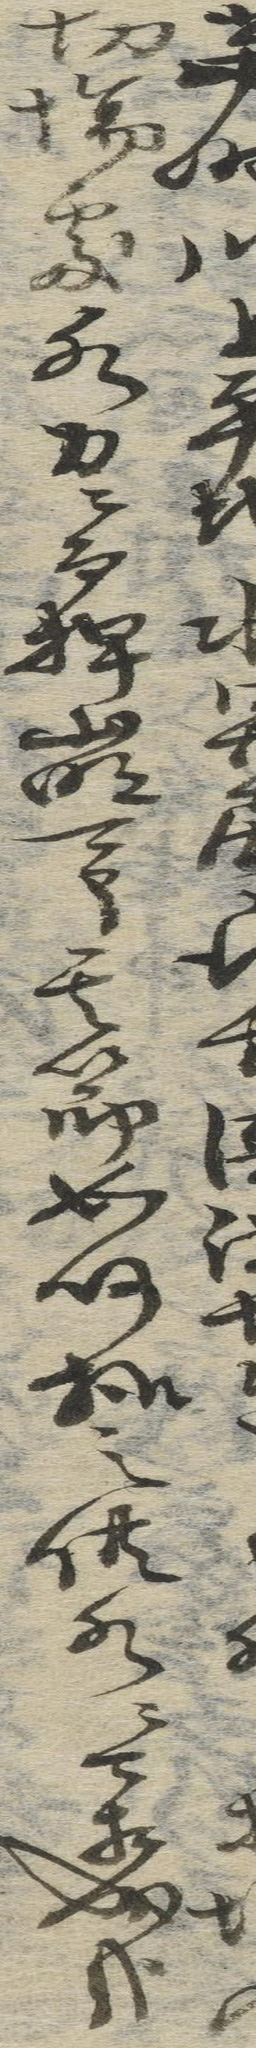切場処水力二而押崩可申其節如何様之洪水二可相成哉
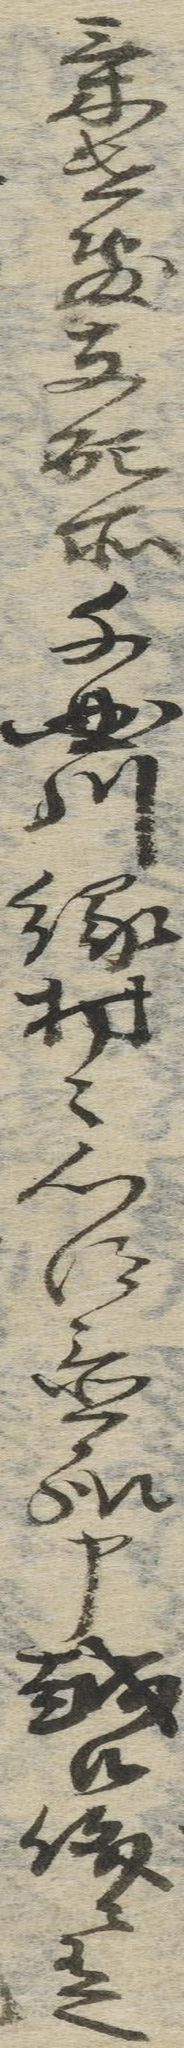気遣敷支配所千曲川縁村々心得置候様申越候儀二有之
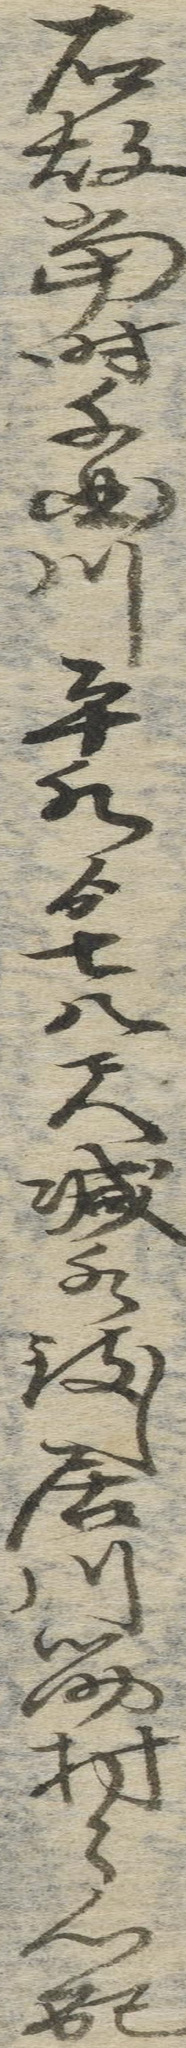右故当時千曲川平水ゟ七八尺減水致し居川筋村々之心配
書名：信濃越後　地震書留
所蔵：東京大学地震研究所図書室 Earthquake Research Institute Library, The University of Tokyo, JAPAN
